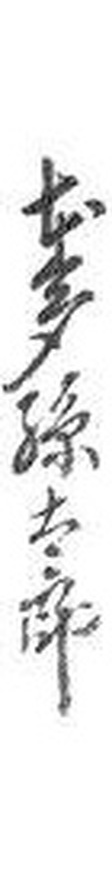本多孫太郎
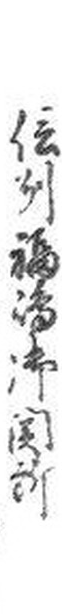信州福嶋御関所
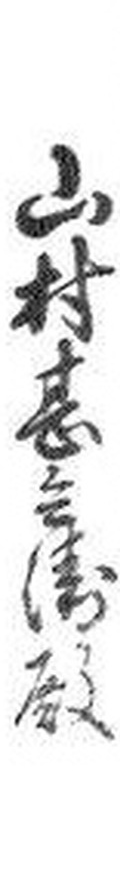山村甚兵衛殿
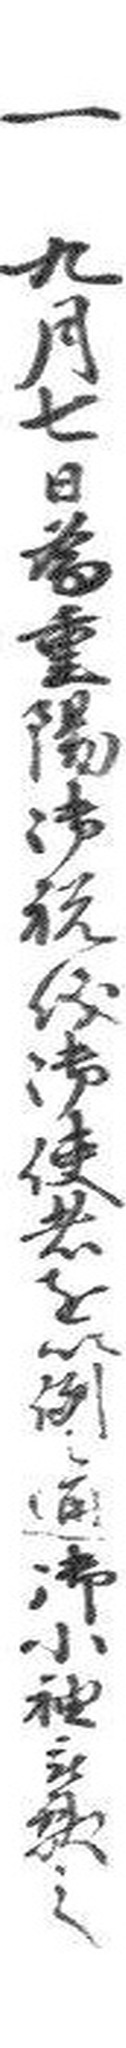一九月七日為重陽御祝儀御使者を以例之通御小袖被献之
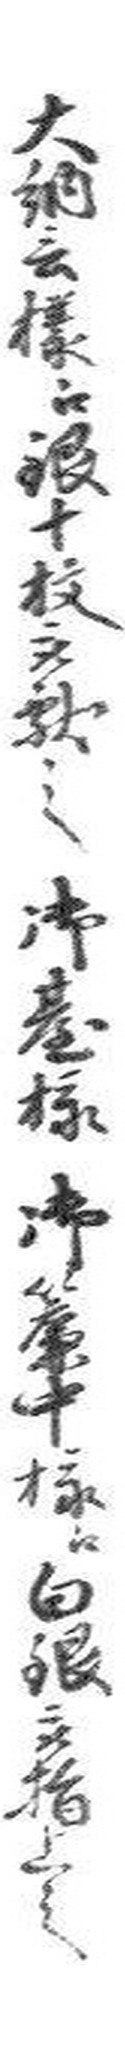大納言様江銀十枚被献之御台様御簾中様江白銀被指上之
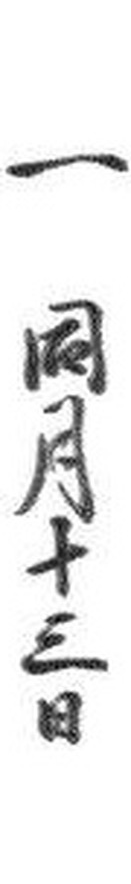一同月十三日
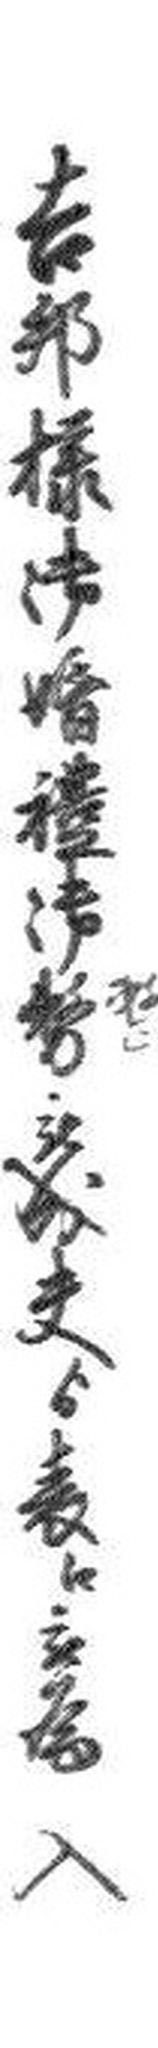吉邦様御婚礼御整被成夫ゟ表江被為入
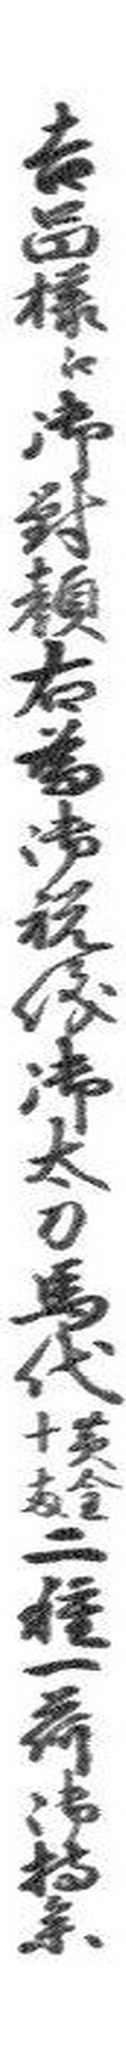吉品様江御対顔右為御祝儀御太刀馬代黄金十両二種一荷御持参
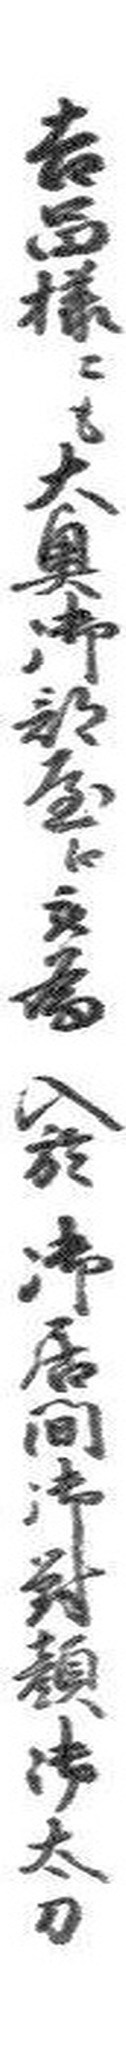吉品様ニも大奥御部屋江被為入於御居間御対顔御太刀
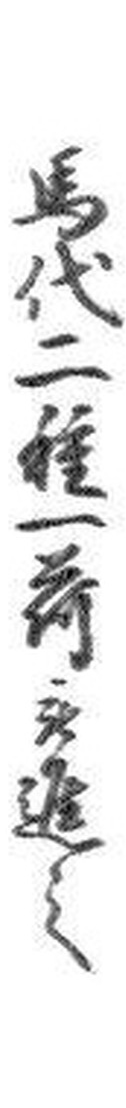馬代ニ種一荷被進之
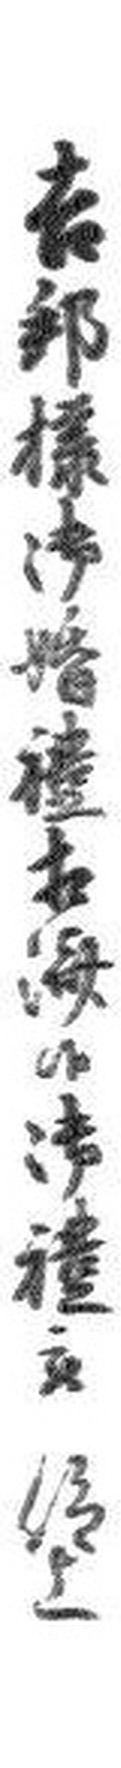吉邦様御婚礼相済候御礼被仰上
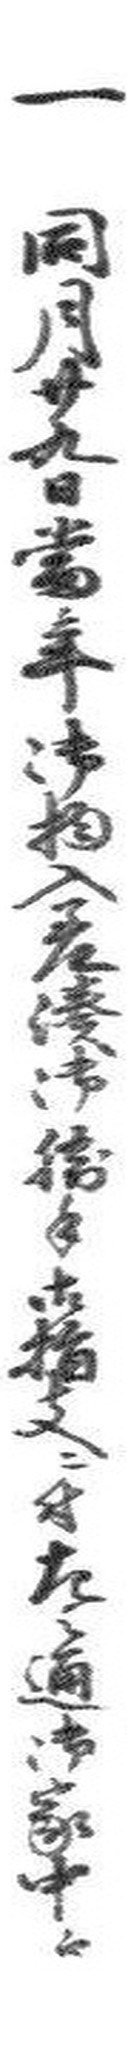一同月廿九日当年御物入差湊御勝手御指支ニ付左之通御家中江

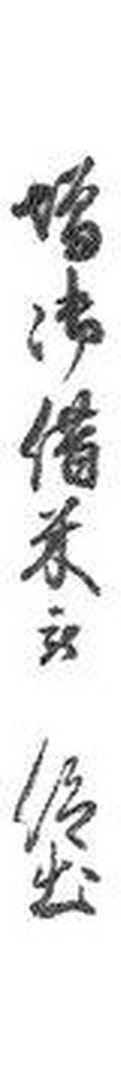増御借米被仰出
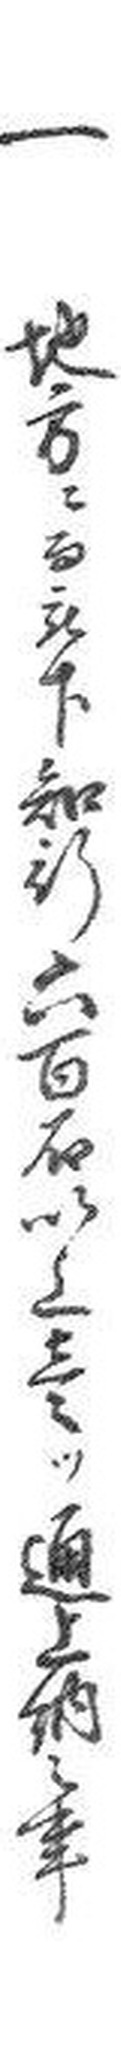一地方ニ而被下知行六百石以上壱ツ通上納之事
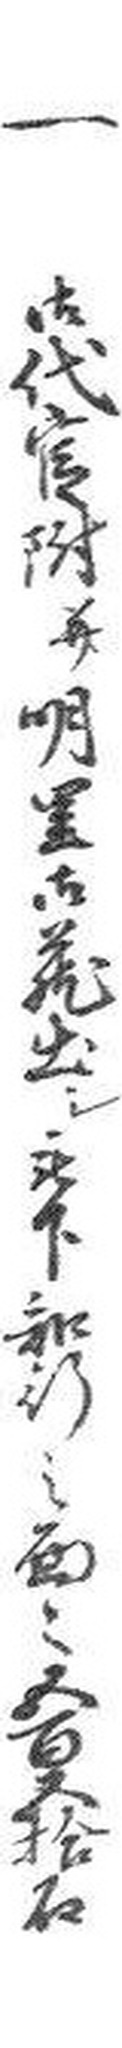一御代官附并明里御蔵出シ被下知行之面々五百五拾石
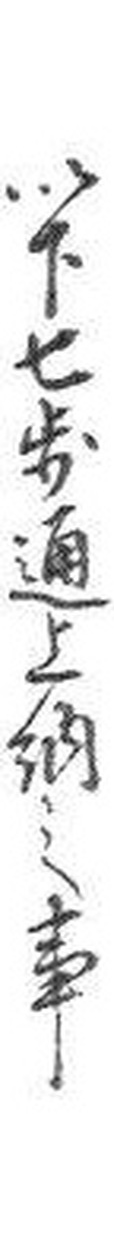以下七歩通上納之事
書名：家譜 二十四 吉品公 従宝永三年到同五年
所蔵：福井県文書館 Fukui Prefectural Archives
